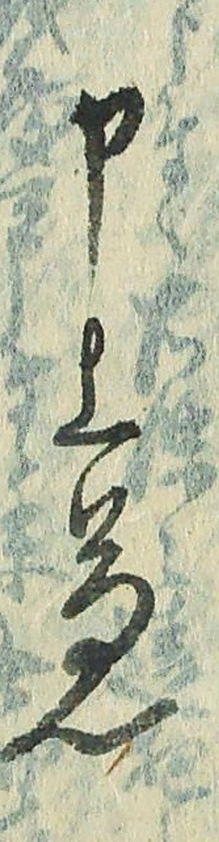申上覚
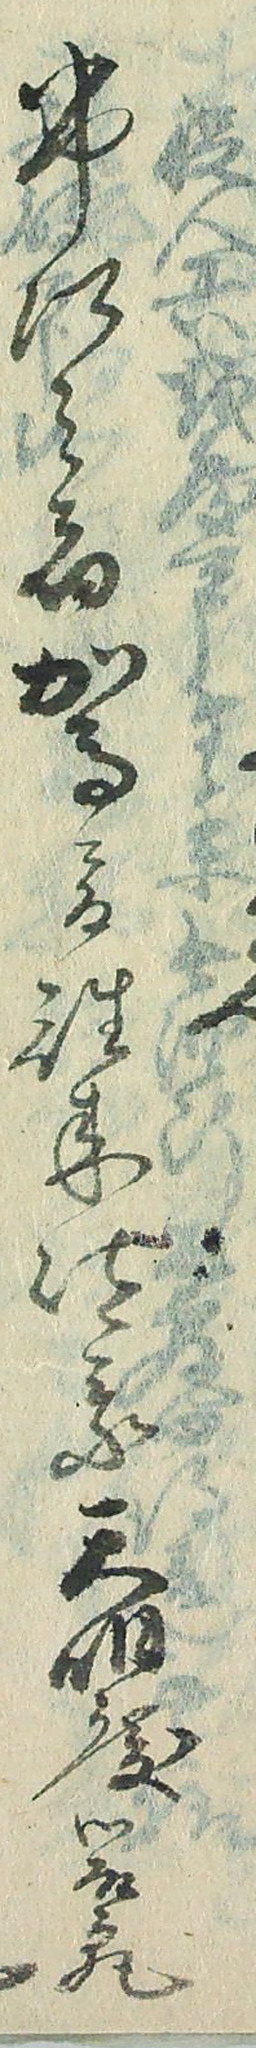市郷之者駕に而往来仕義天明度御取究
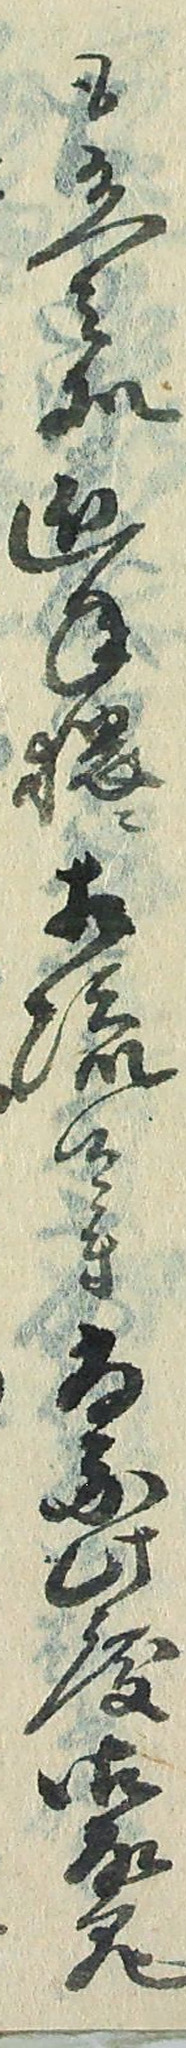も有之処近年猥に相流候に付尚亦此度御取究
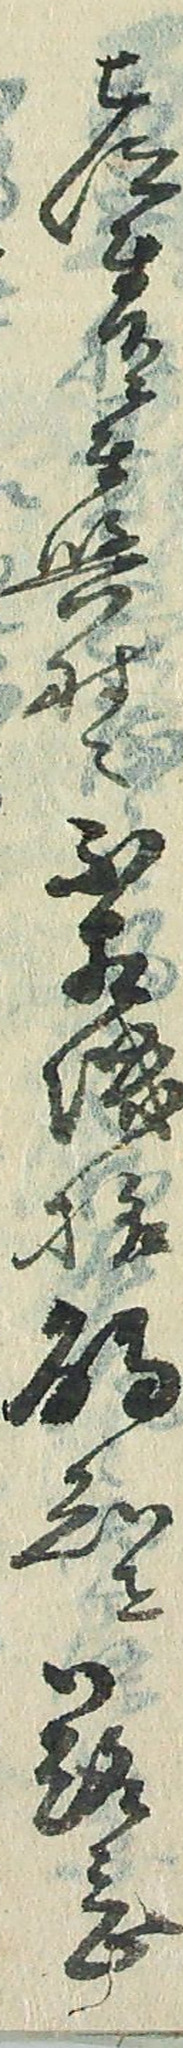被仰付候に付与村々不相洩様触知せ御趣意
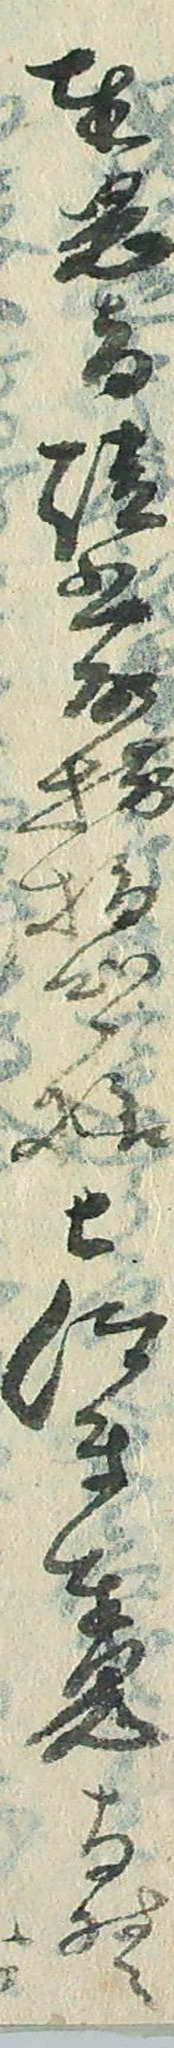奉畏旨請書取揃指出候様被仰付奉畏与村々
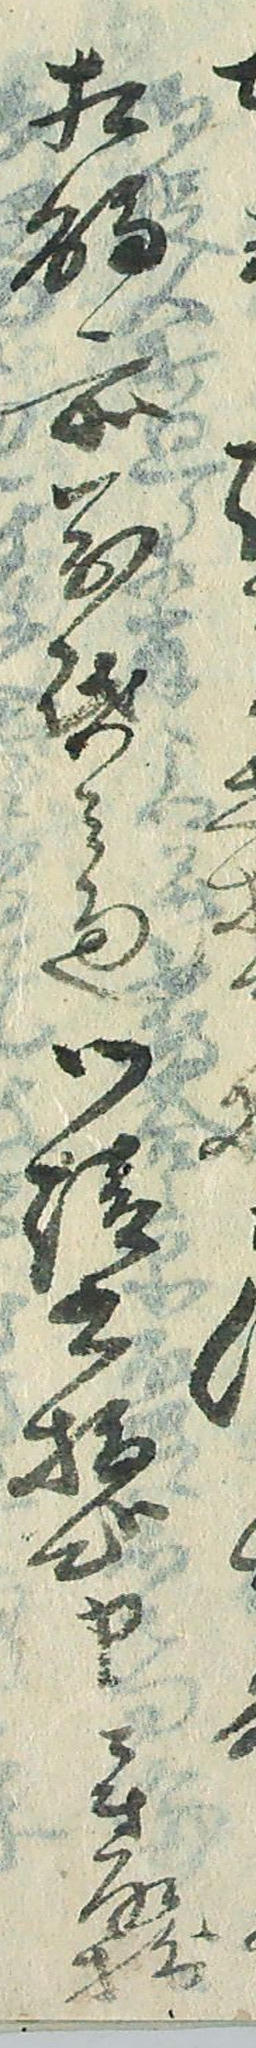相触候所別帋之通御請書指出申に付取揃
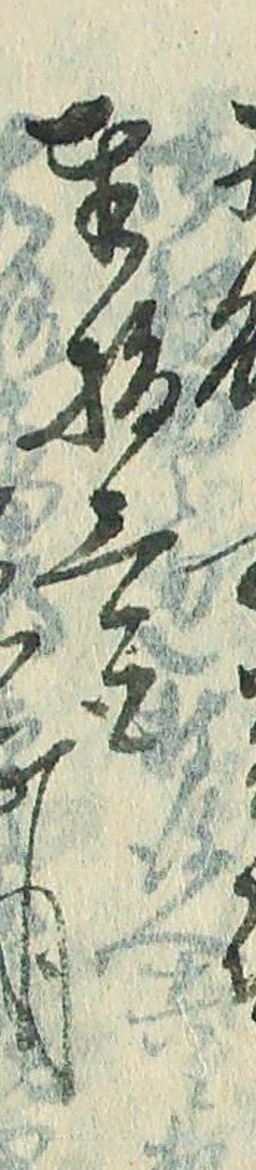奉指上候以上
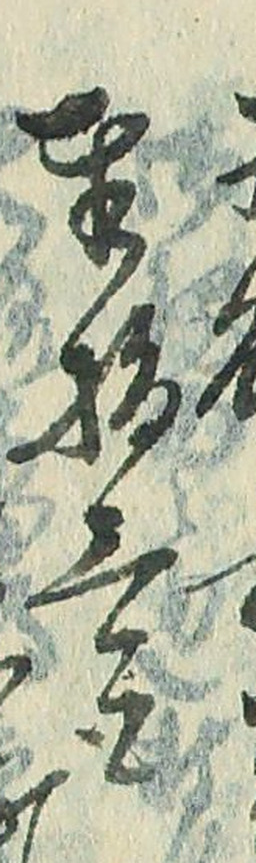奉指上候以上
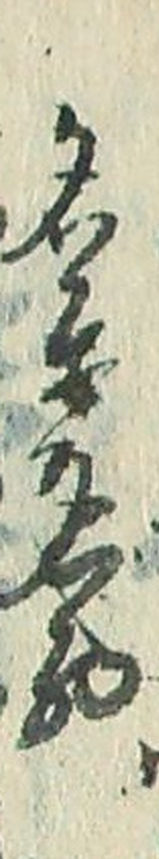名東名西

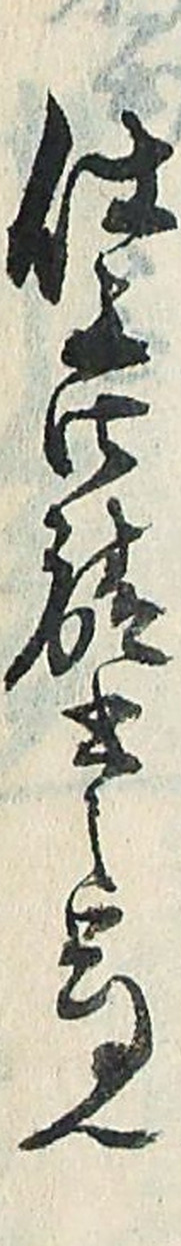仕上御請書之覚
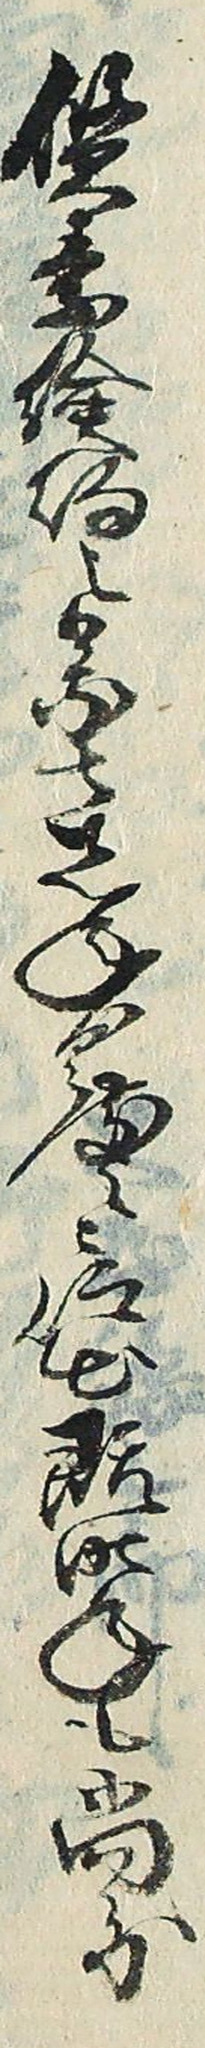質素倹約之義は先年ゟ度々被仰出既昨年も尚亦
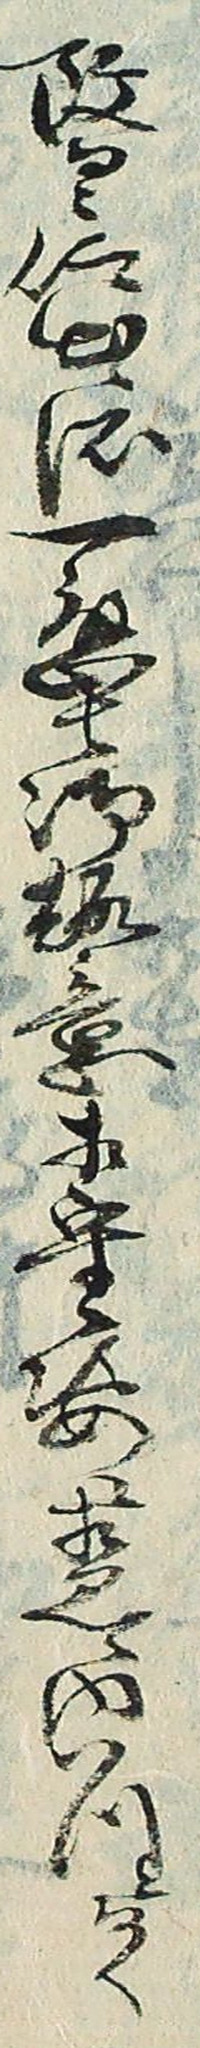改而被仰出候所一応は御趣意相守候姿に相見候内いつとなく
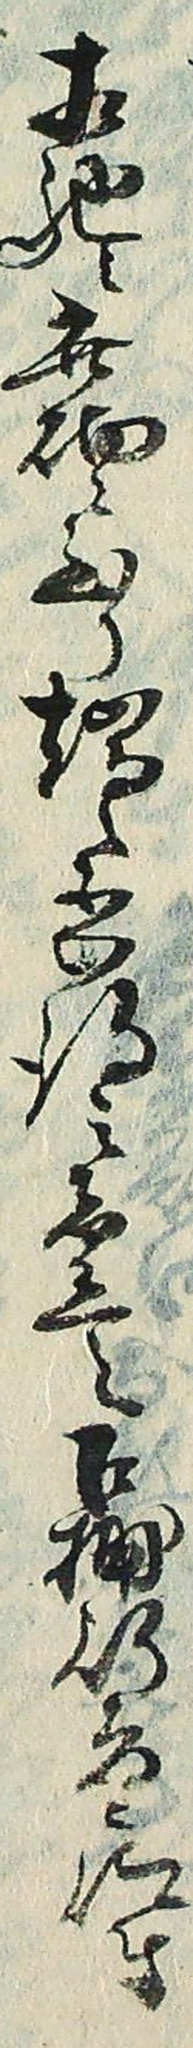相弛み此砌に至り端々不心得之者有之候召捕行者被仰付
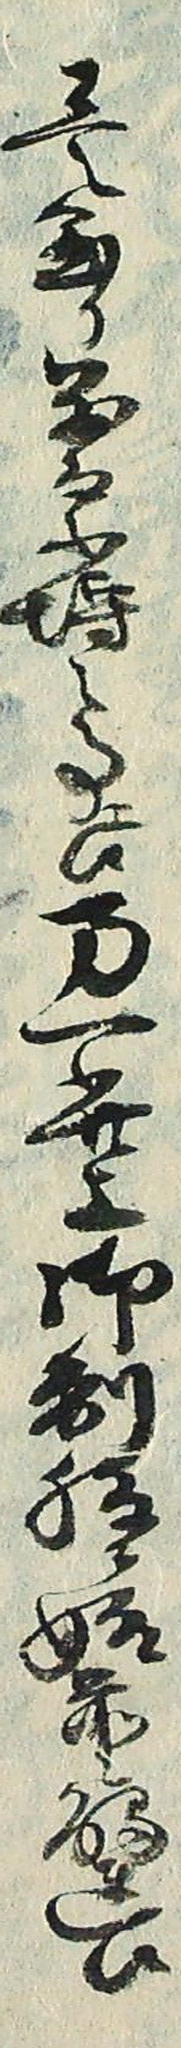有之懸り別而不埒之事に候万一此上御制服を始前々触達候
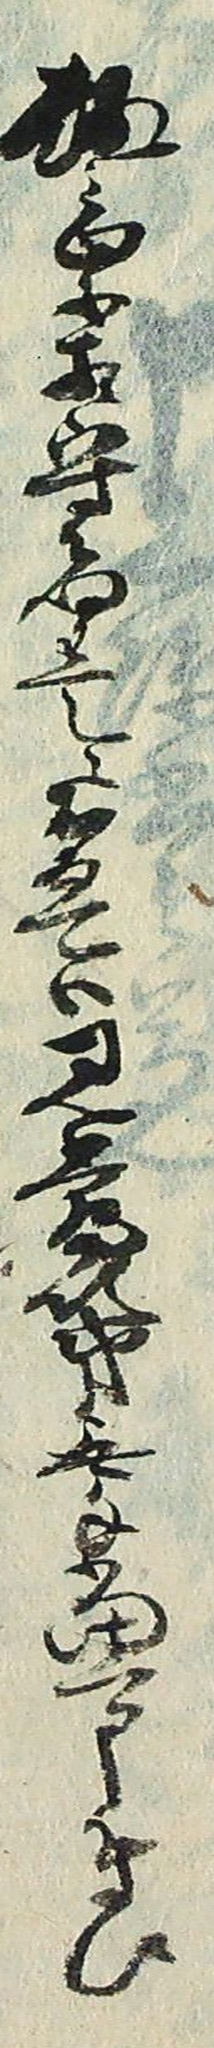趣意不相守者有之におゐては見当次第無手当可申付候
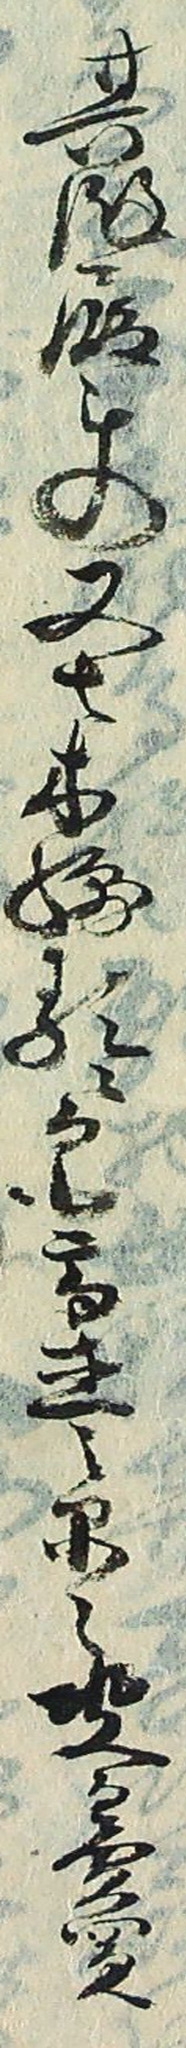其余履もの又は木綿類に而も高直之品々決而売買
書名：諸御用御□受書控
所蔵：鳴門教育大学 Naruto University of Education
